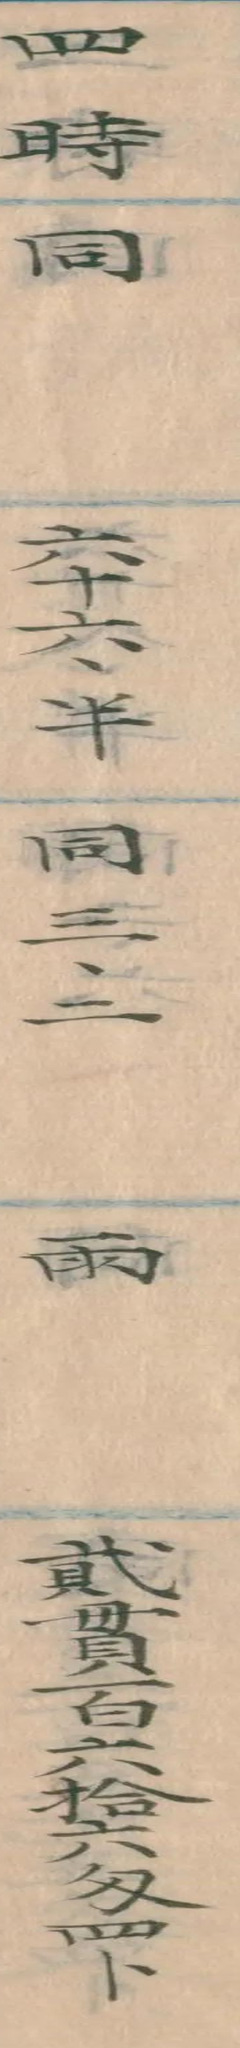四時同六十六ヽ半同三ヽ二雨弐貫百六十六匁四分
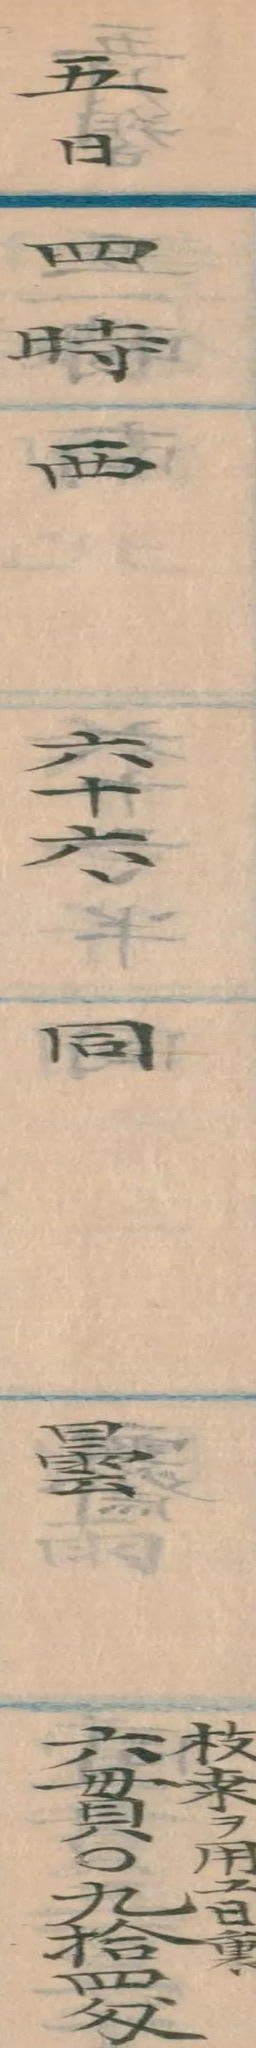五日四時西六十六ヽ同曇六貫〇九拾四匁二分
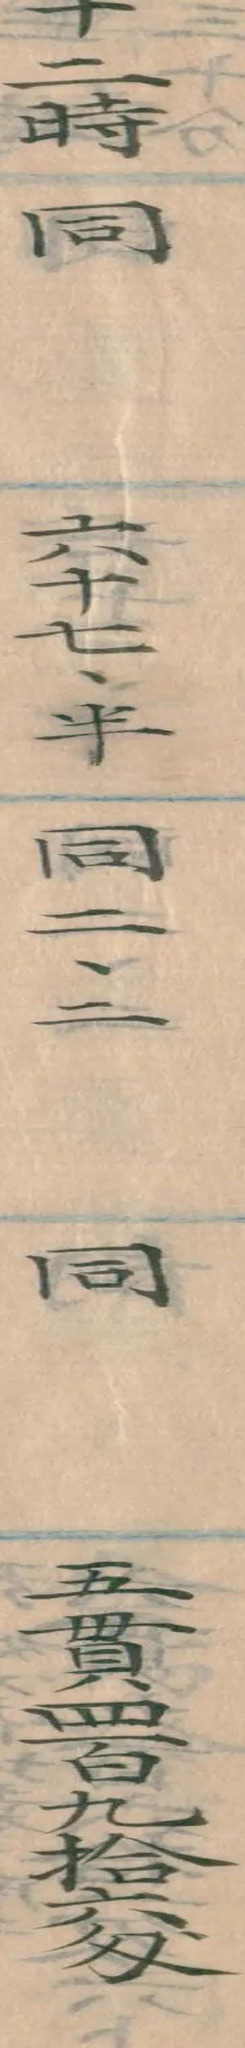十二時同六十七ヽ半同二ヽ二同五貫四百九拾六匁
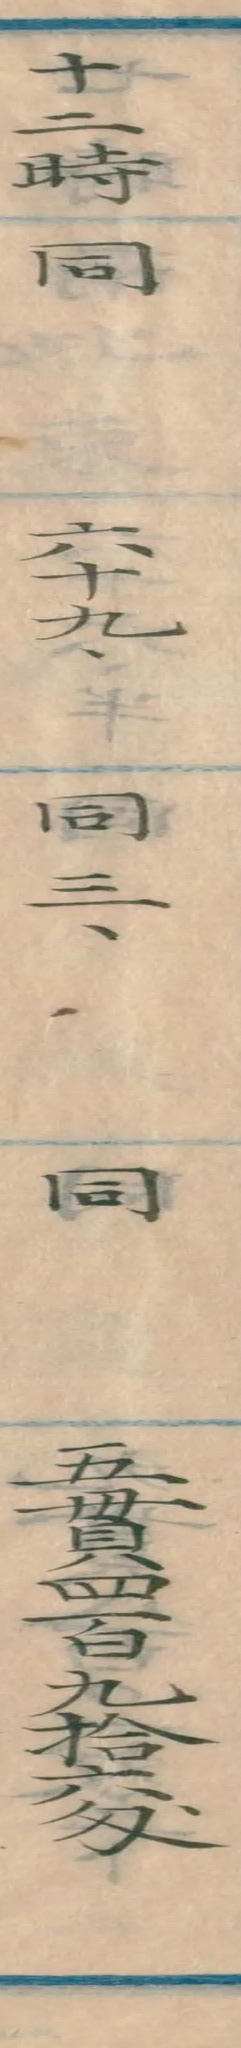十二時同六十九ヽ同三ヽ同五貫四百九拾六匁
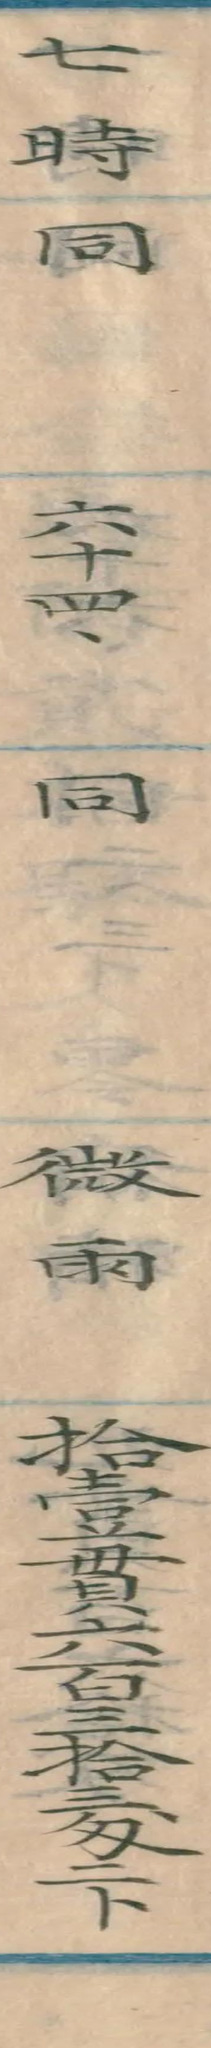七時同六十四ヽ同微雨拾壱貫六百三拾三匁二分
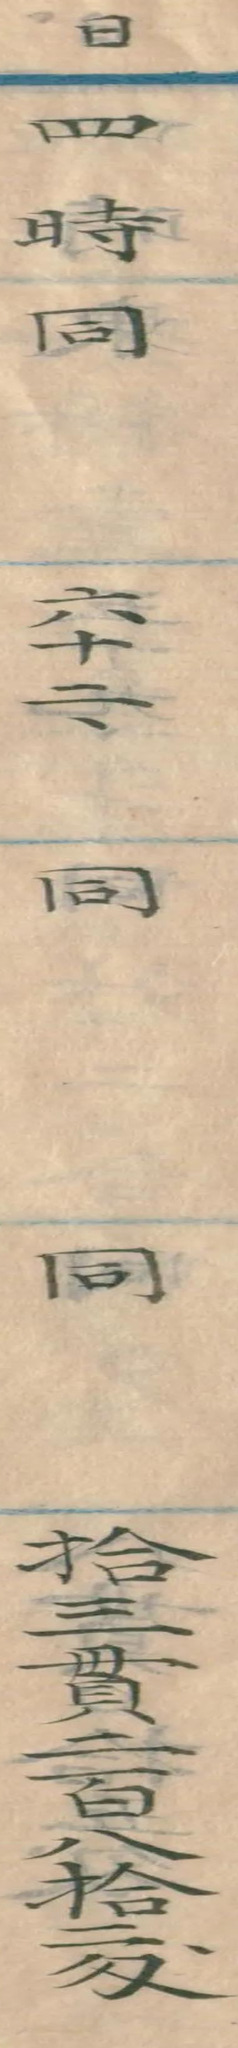八日四時同六十二ヽ同同拾三貫二百八拾二匁
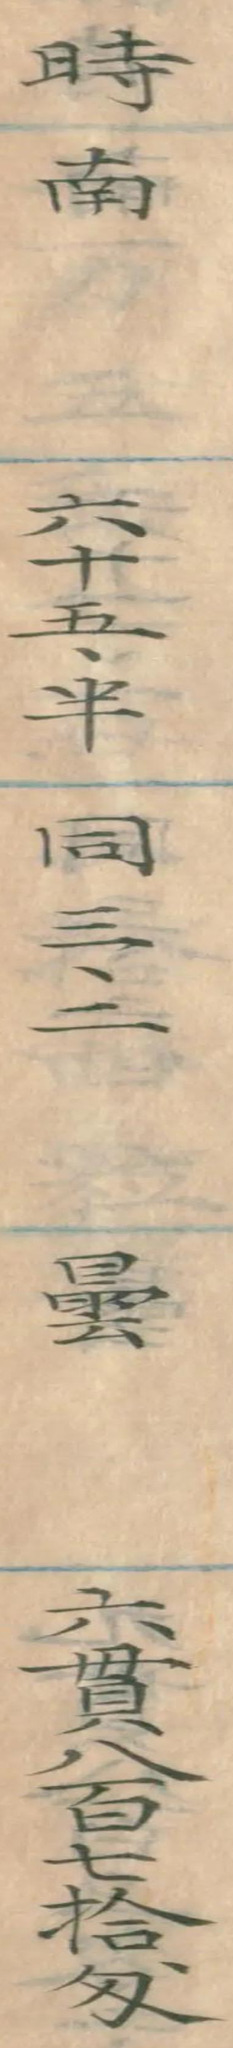一時南六十五ヽ半同三ヽ二曇六貫八百七拾匁

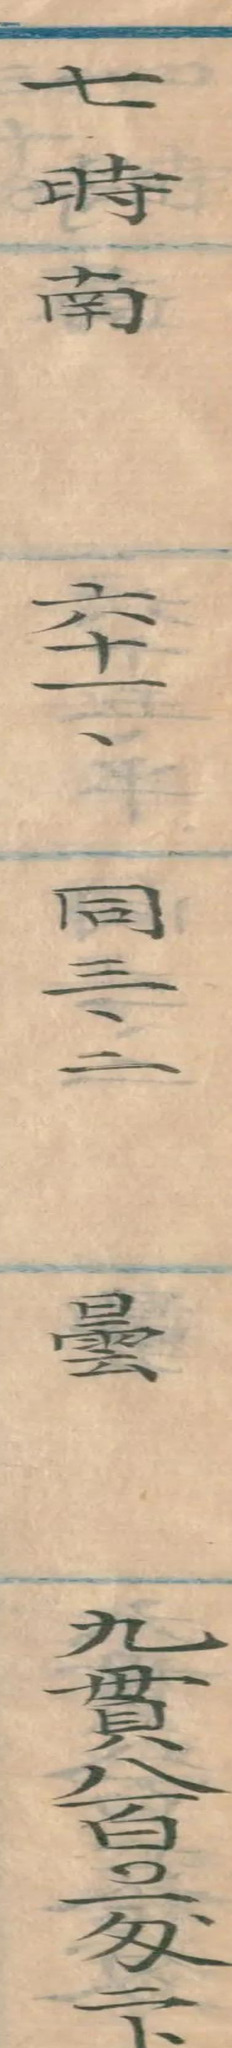七時南六十一ヽ同三ヽ二曇九貫八百〇一匁二分
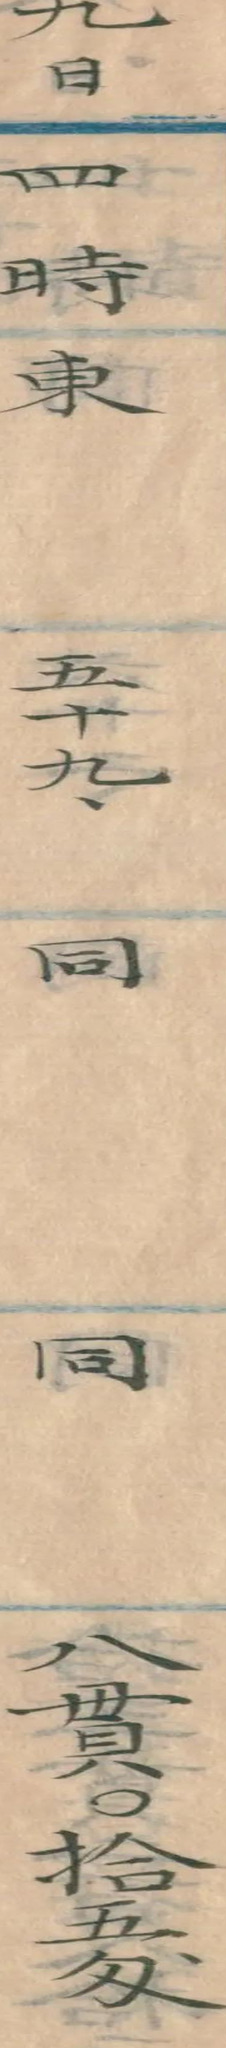九日四時東五十九ヽ同同八貫〇拾五匁
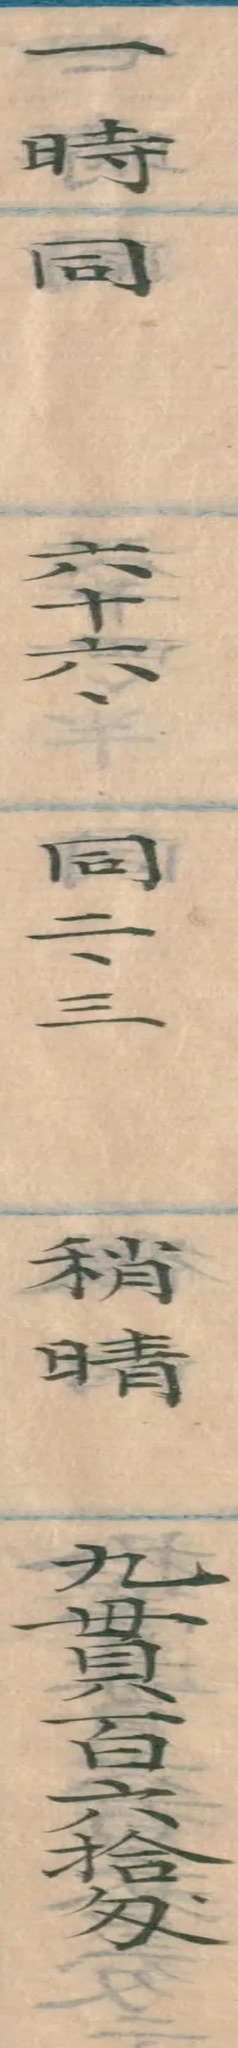一時同六十六ヽ同二ヽ三稍晴九貫百六拾匁
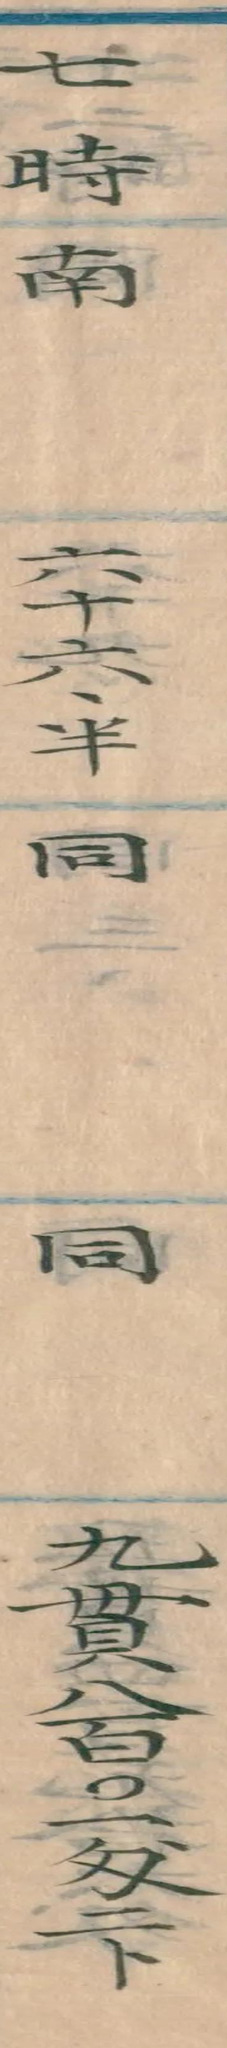七時南六十六ヽ半同同九貫八百〇一匁二分
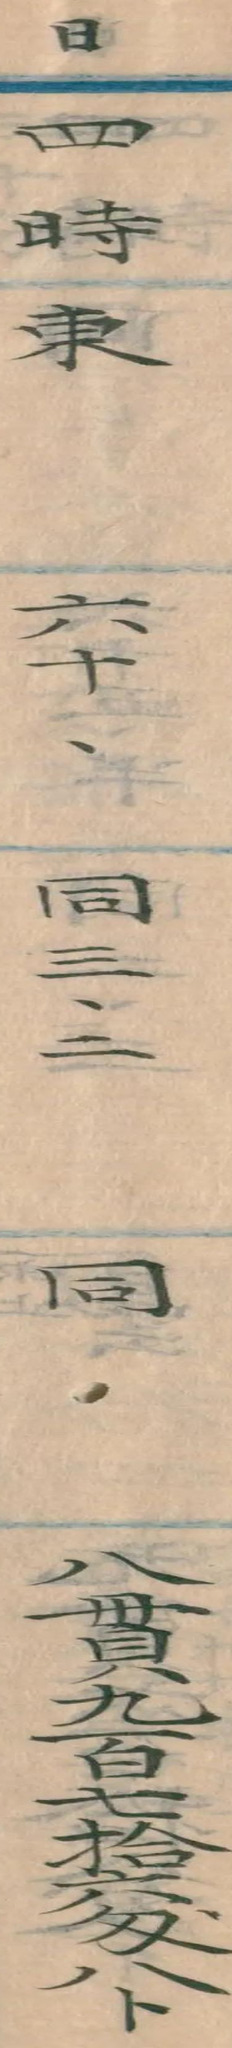十日四時東六十ヽ同三ヽ二同八貫九百七拾六匁八分
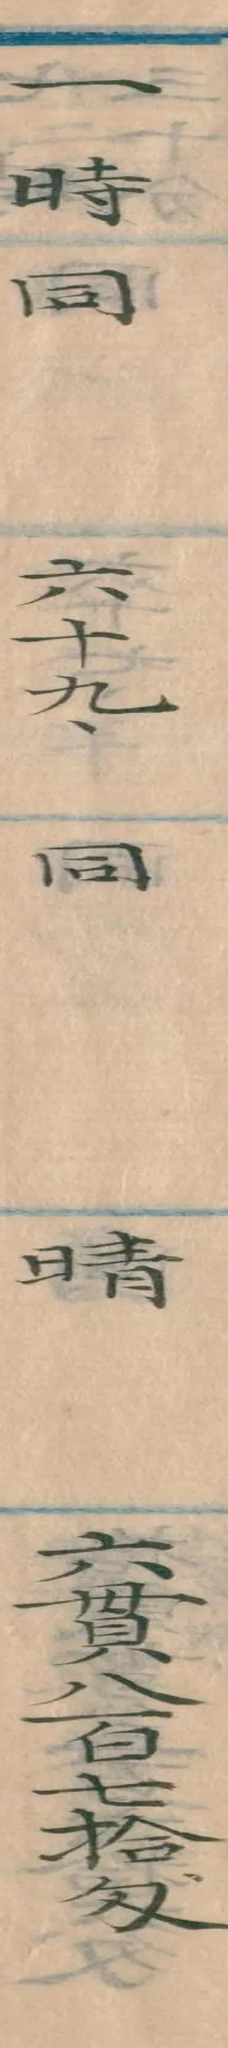一時同六十九ヽ同晴六貫八百七拾匁
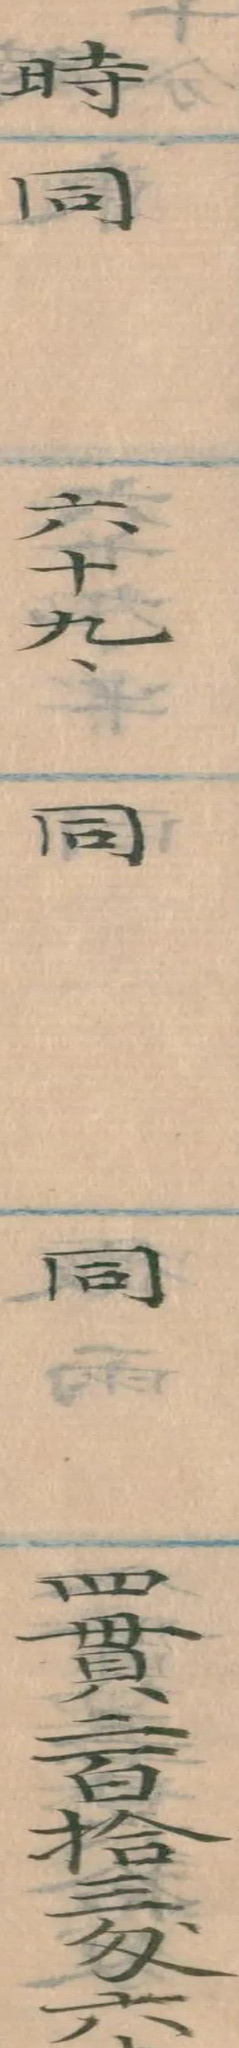七時同六十九ヽ同同四貫二百拾三匁六分
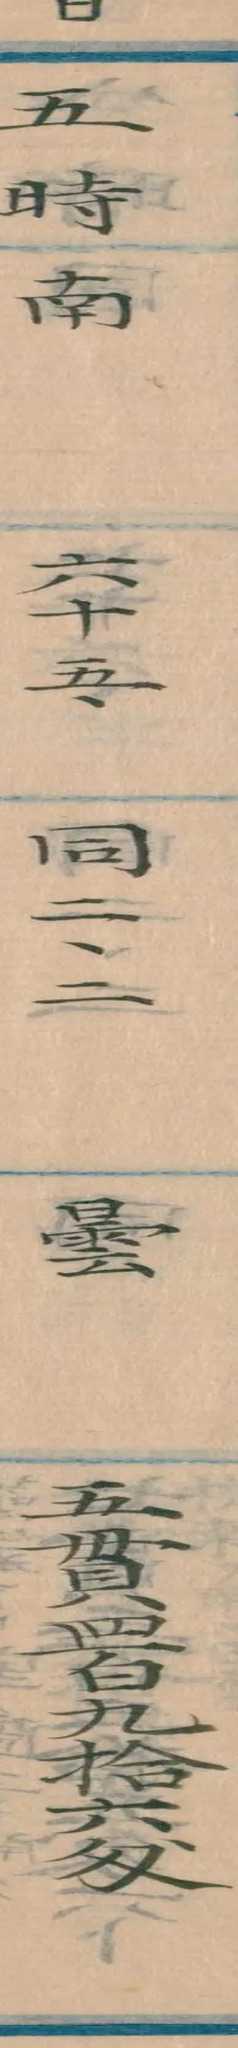十一日五時南六十五ヽ同二ヽ二曇五貫四百九拾六匁
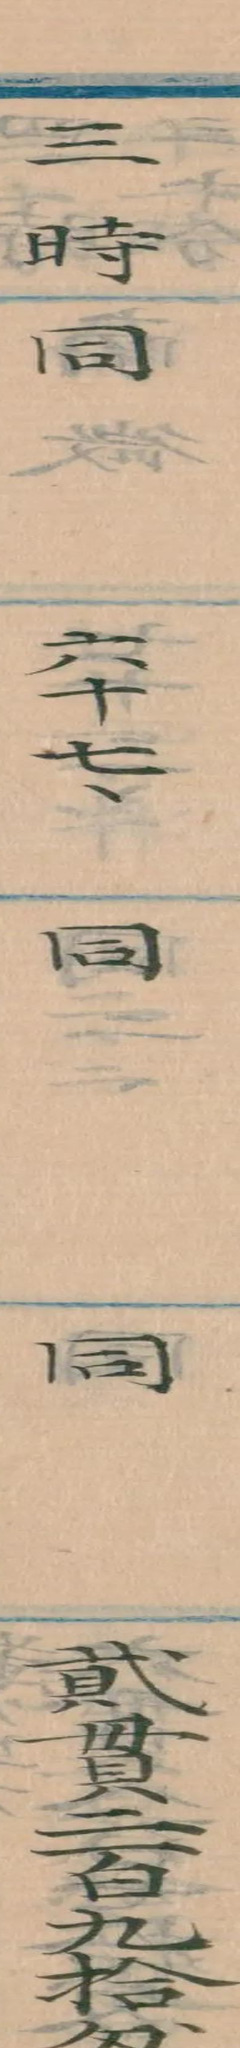三時同六十七ヽ同同弐貫二百九拾匁
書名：蚕桑集成
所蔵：国立国会図書館 National Diet Library, JAPAN
